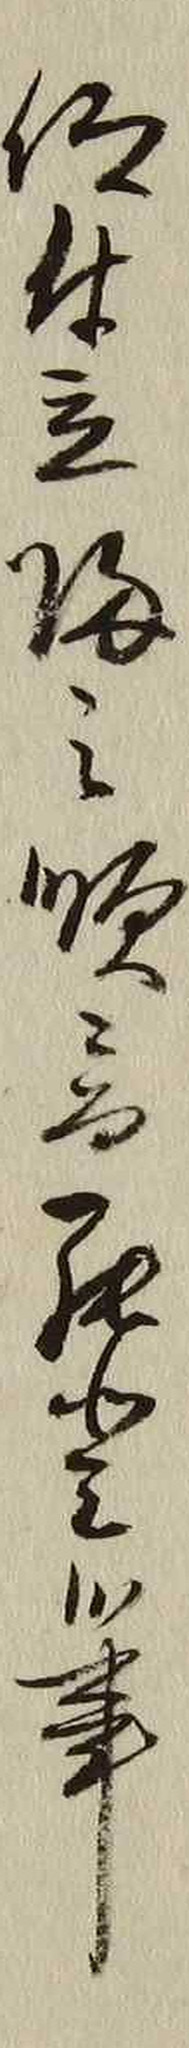仰付立帰之順ニ而罷登候事
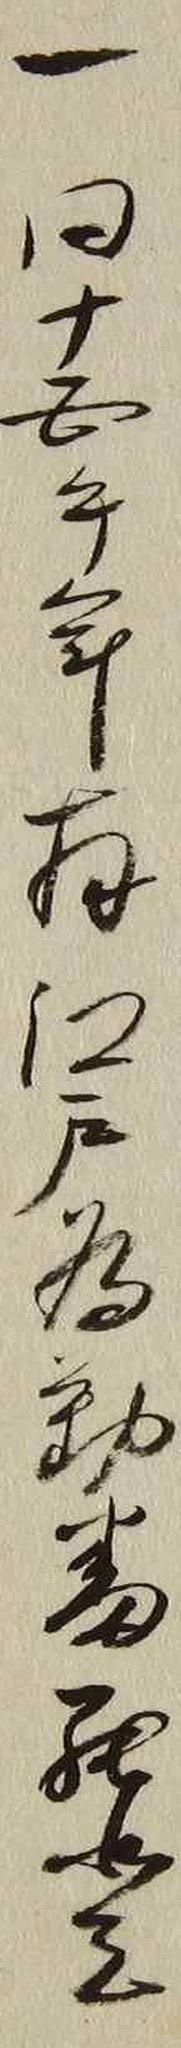一同十五午年於江戸為勤番罷登
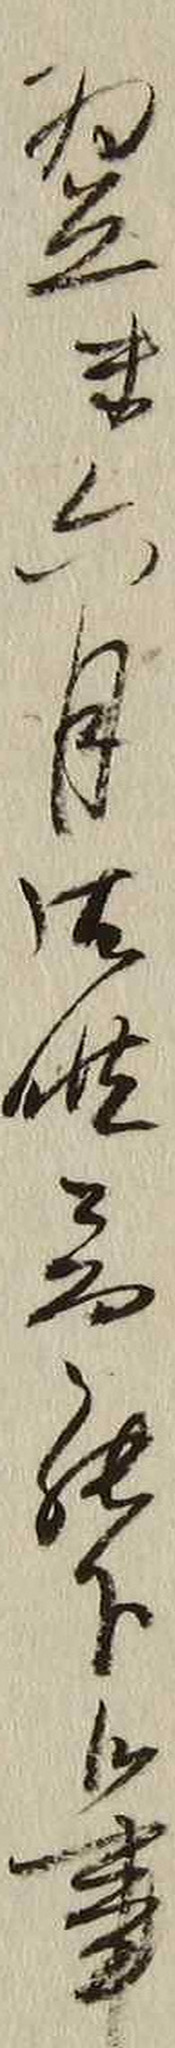翌未六月御供ニ而罷下候事
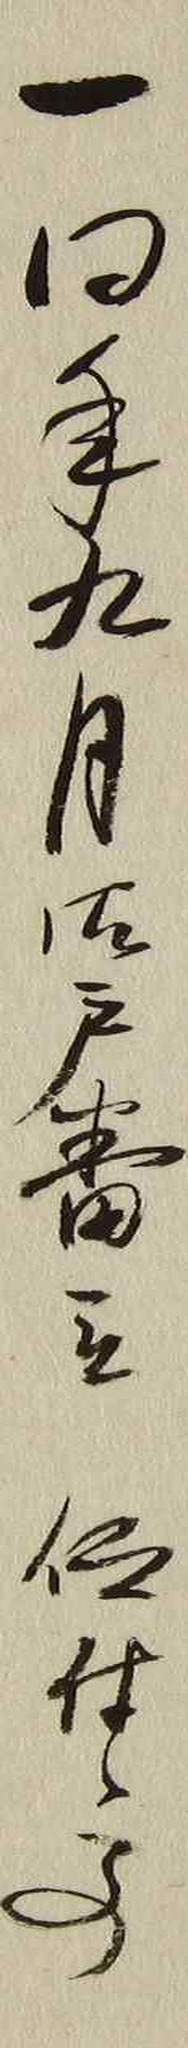一同年九月御戸番被仰付候事
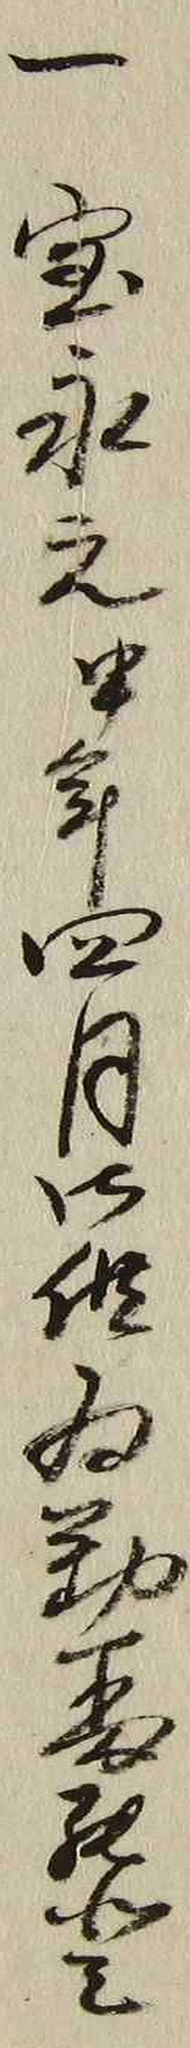一宝永元申年四月御供為勤番罷登
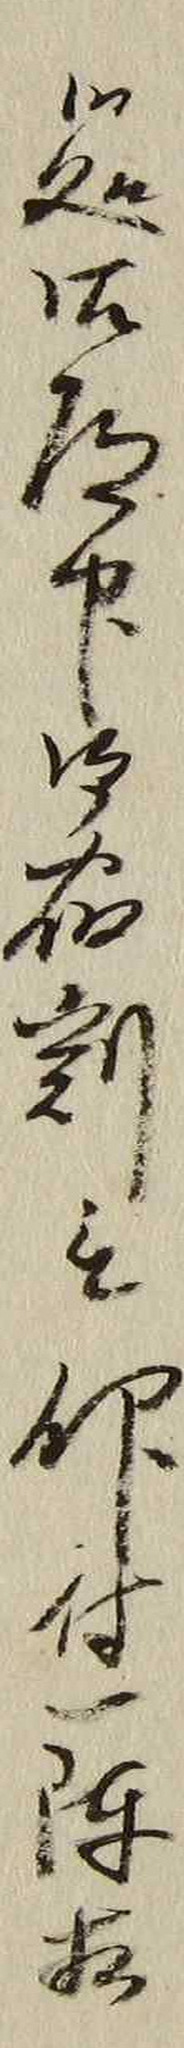候処御道中御宿割被仰付一陣相
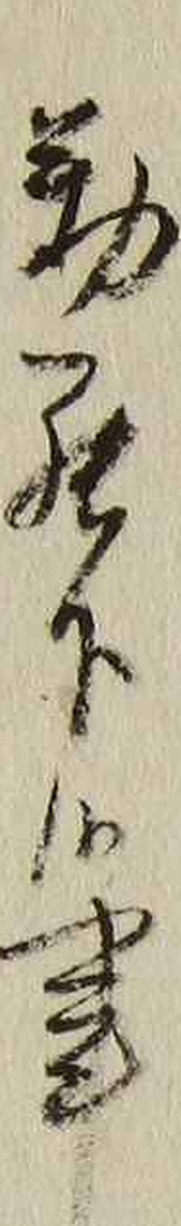勤罷下候事
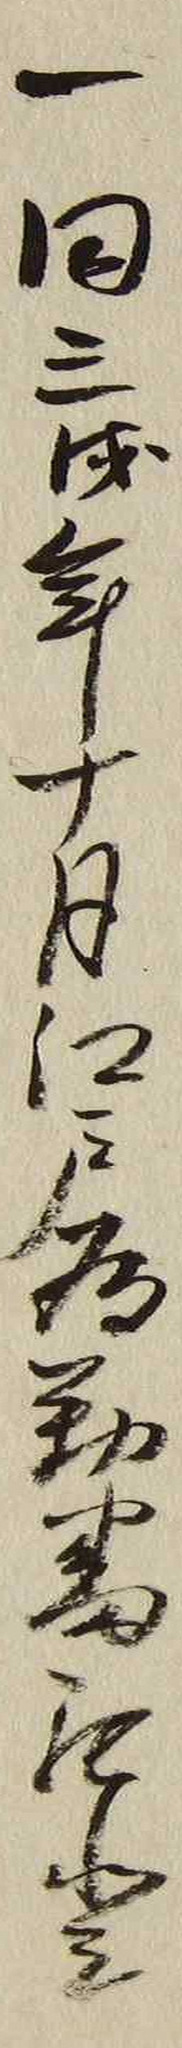一同三戌年十月江戸為勤番罷登
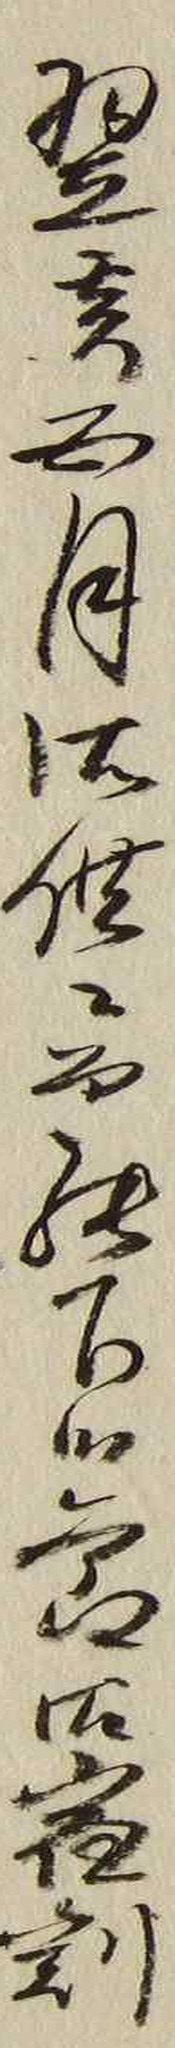翌亥五月御供ニ而罷下候節御宿割
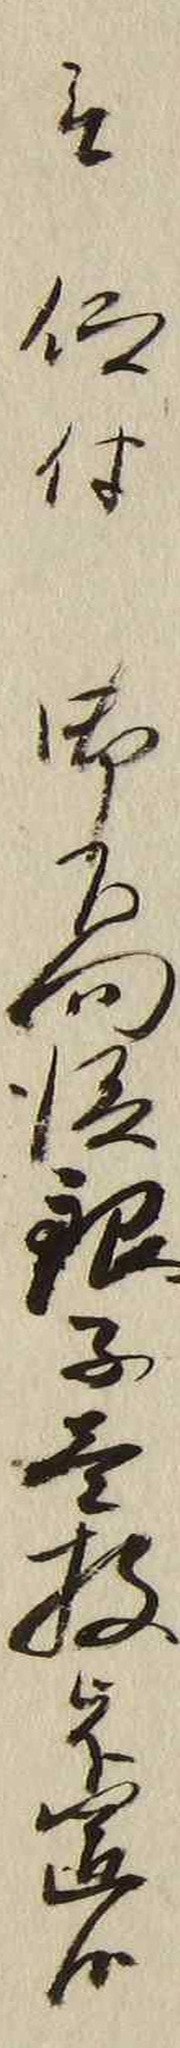被仰付御下向後銀子壱枚被下置候

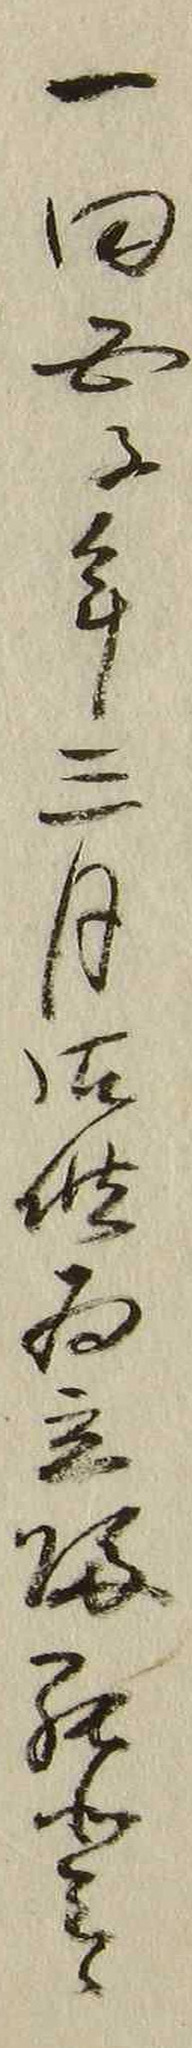一同五子年三月御供為立帰罷登候
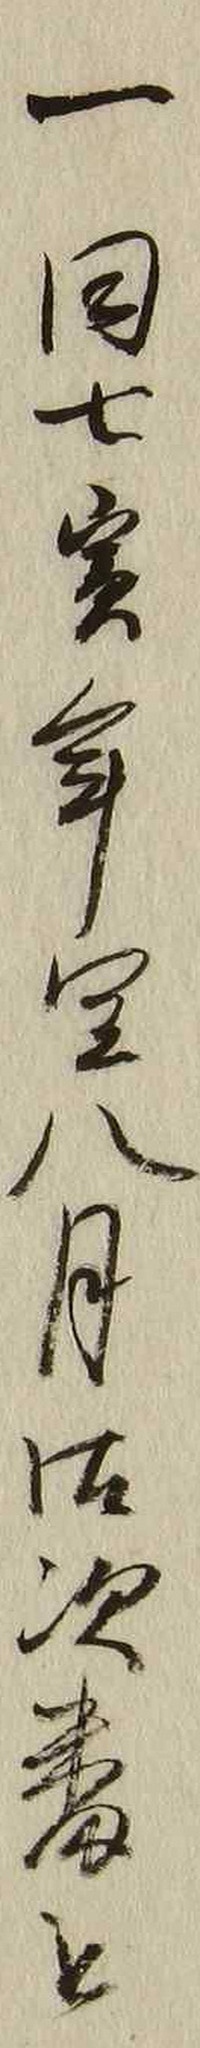一同七寅年閏八月御次番被
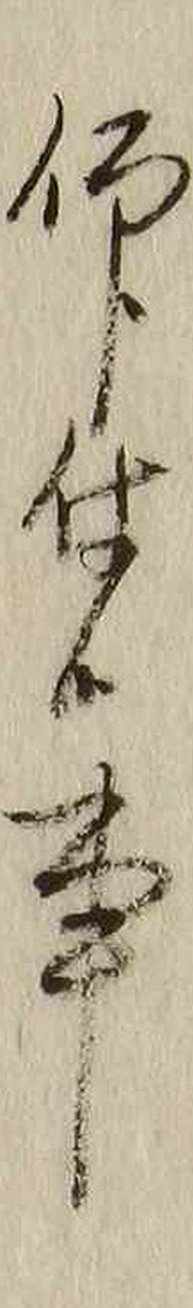仰付候事
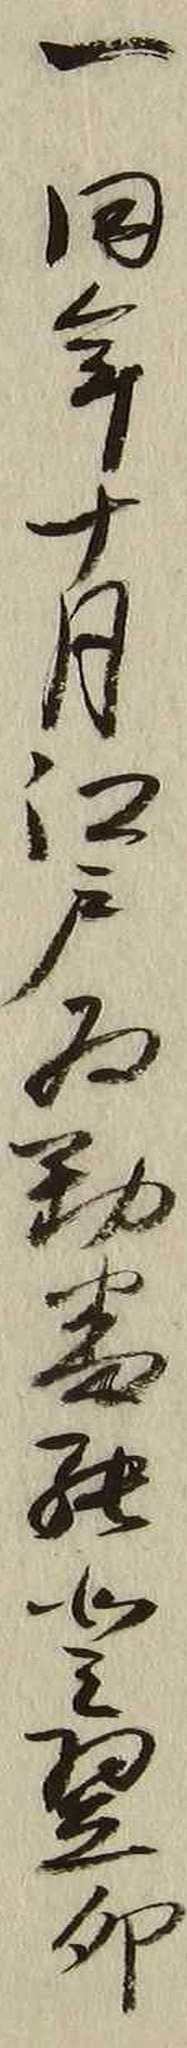一同年十月江戸為勤番罷登翌卯
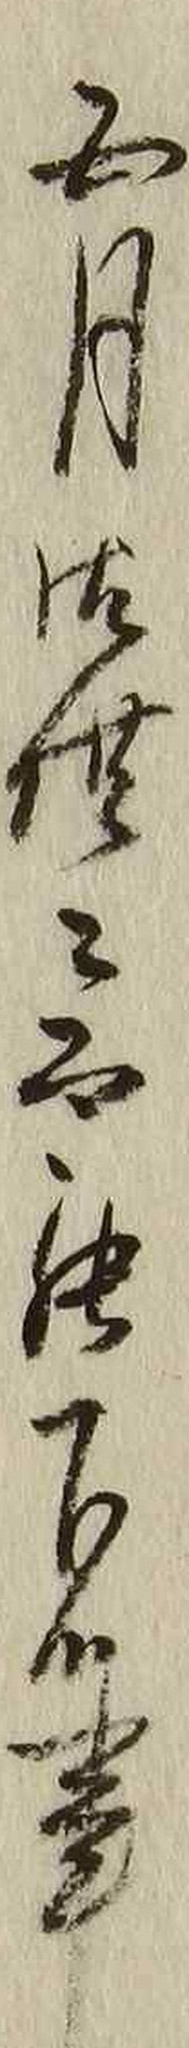五月御供ニ而罷下候事
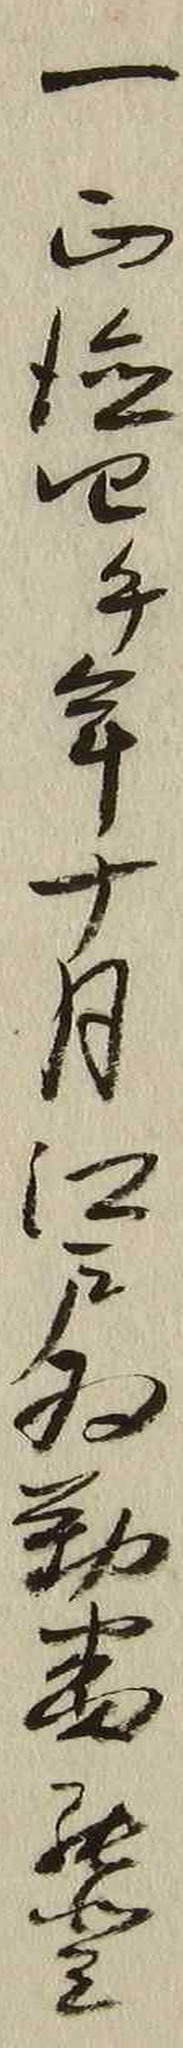一正徳四午年十月江戸為勤番罷登
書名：諸士系譜　巻之349　も之部5
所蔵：会津若松市立会津図書館
